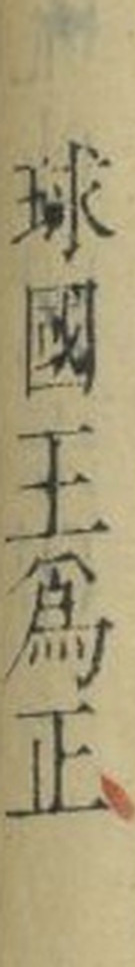球國王爲正

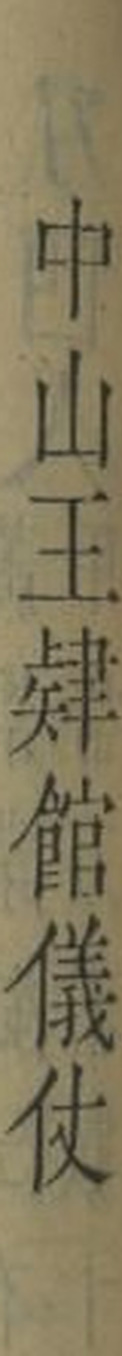中山王肄館儀仗
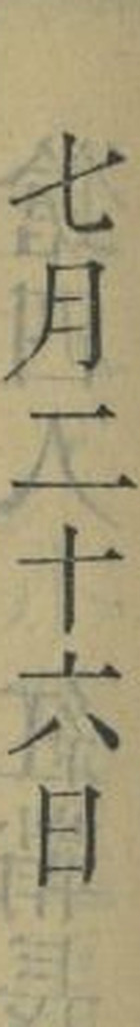七月二十六日
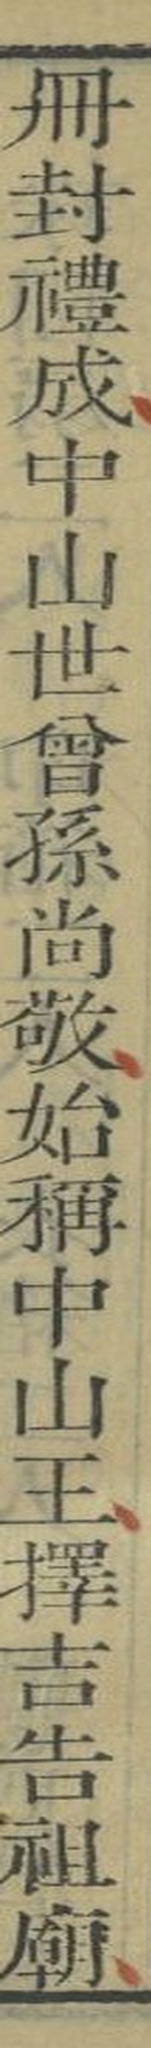冊封禮成中山世曾孫尚敬始稱中山王擇吉告祖廟
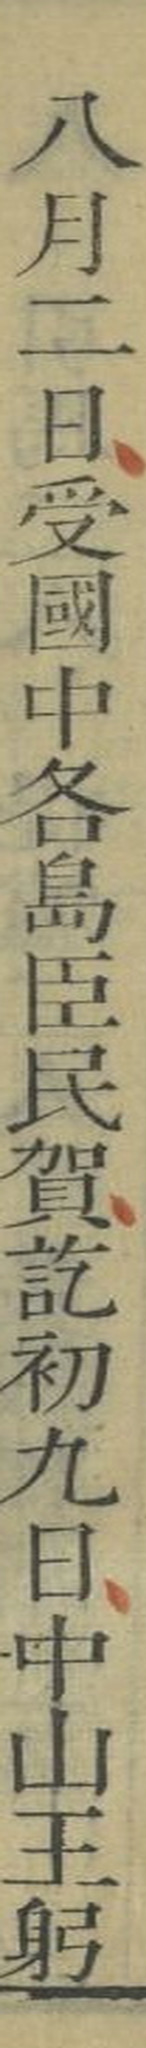八月二日受國中各島臣民賀訖初九日中山王躬
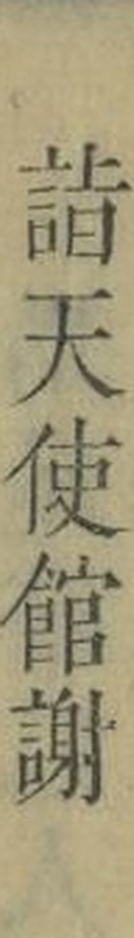詣天使館謝
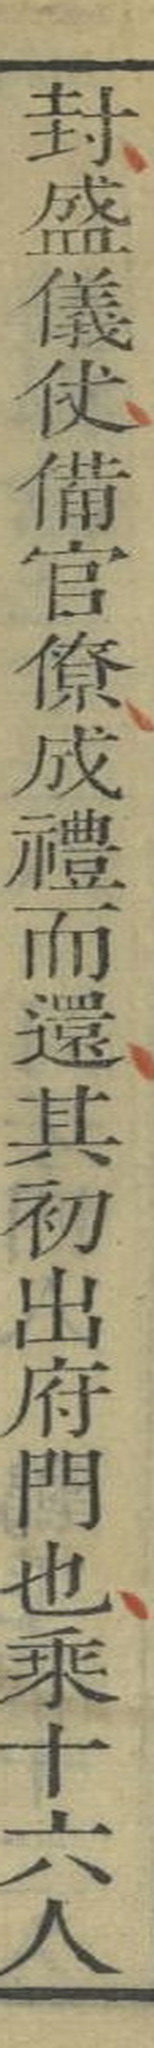封盛儀仗備官僚成禮而還其初出府門也乘十六人
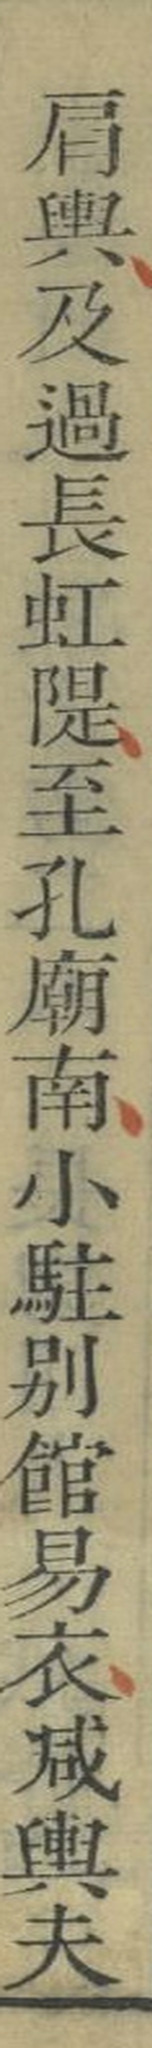肩輿及過長虹隄至孔廟南小駐別館易衣減輿夫
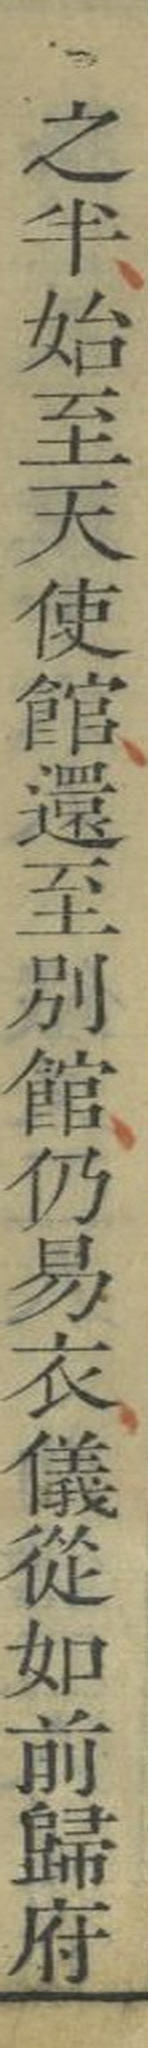之半始至天使館還至別館仍易衣儀從如前歸府
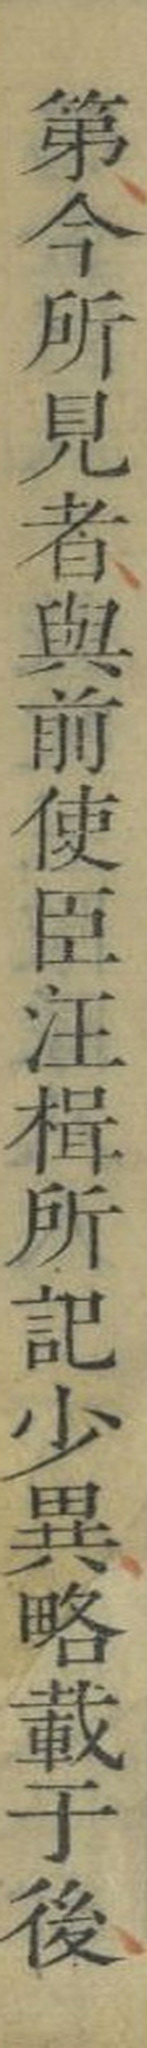第今所見者與前使臣汪楫所記少異略載于後

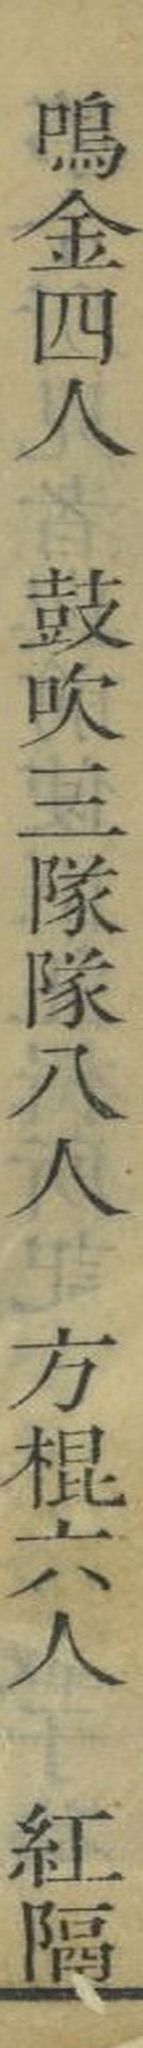鳴金四人鼓吹三隊隊八人方棍六人紅隔
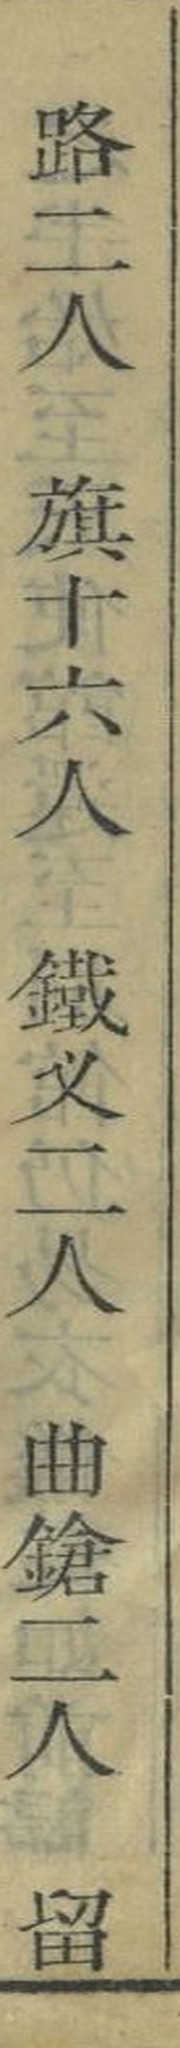路二人旗十六人鐵义二人曲鎗二人留
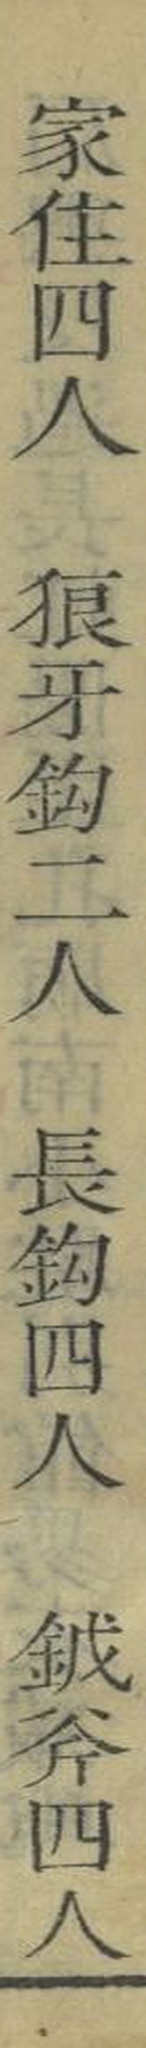家住四人狼牙鈎二人長鈎四人鉞斧四人
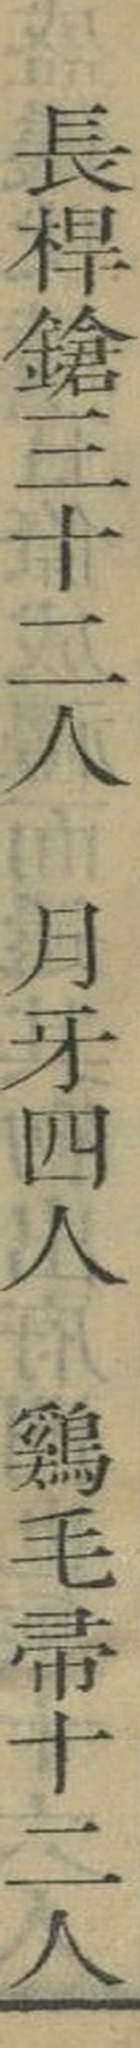長桿鎗三十二人月牙四人鷄毛帚十二人
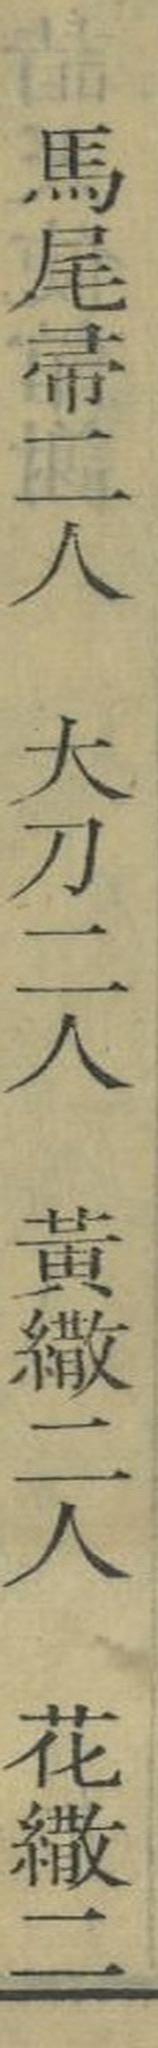馬尾帚二人大刀二人黃繖二人花繖二
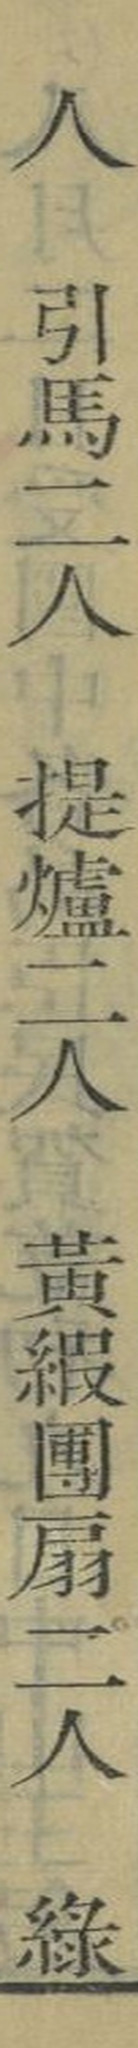人引馬二人提爐二人黃縀團扇二人綠
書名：中山伝信録 巻一、巻二
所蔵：University of the Ryukyus Library
